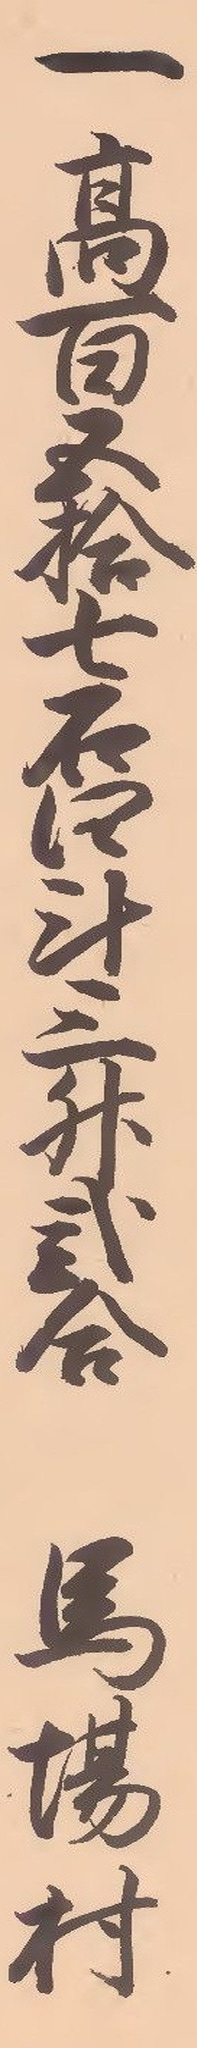一高百五拾七石四斗三升弐合馬場村

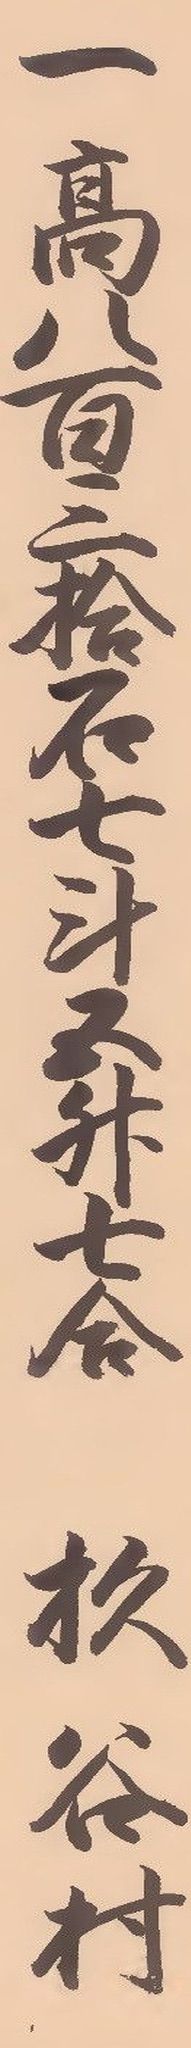一高八百三拾石七斗五升七合杉谷村
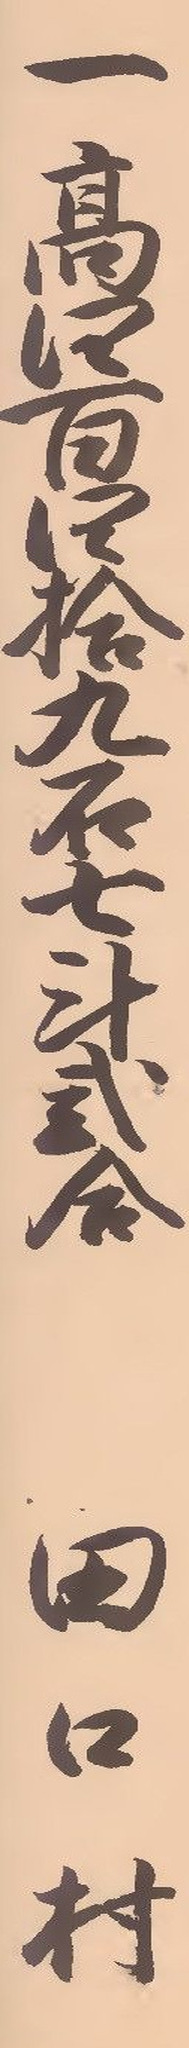一高四百四拾九石七斗弐合田口村
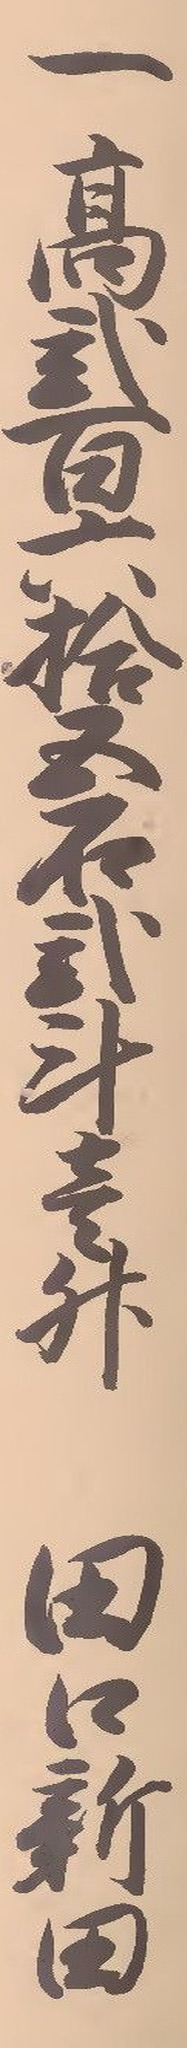一高弐百六拾五石弐斗壱升田口新田
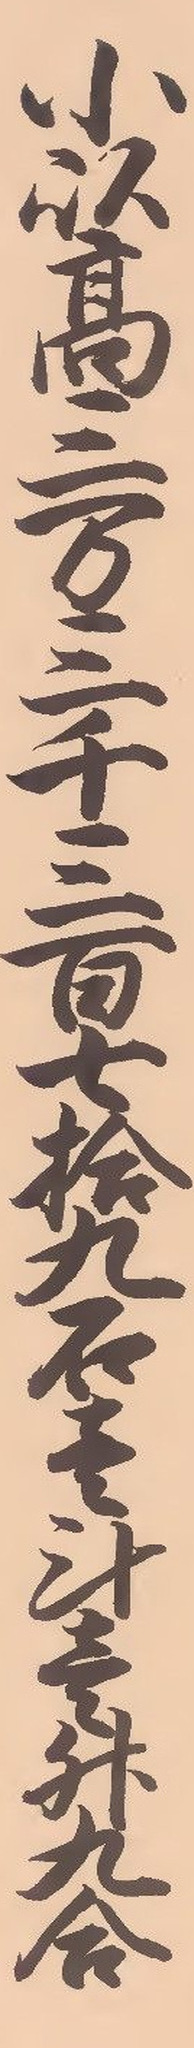小以高三万三千三百七拾九石壱斗壱升九合

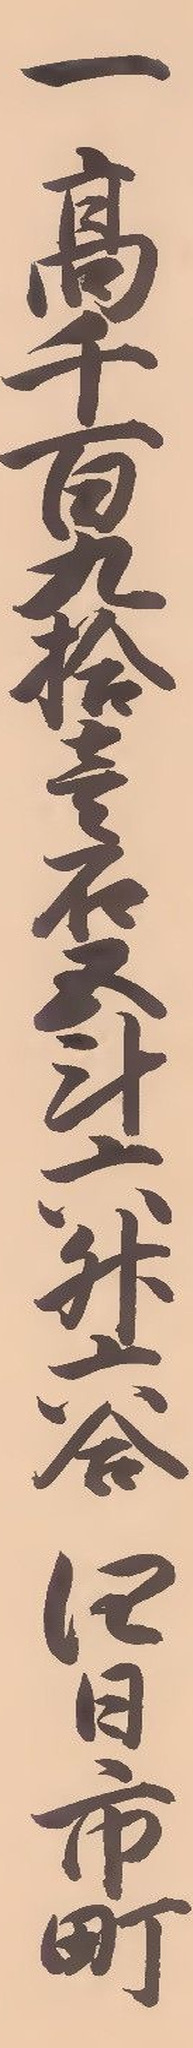一高千百九拾壱石五斗六升六合四日市町
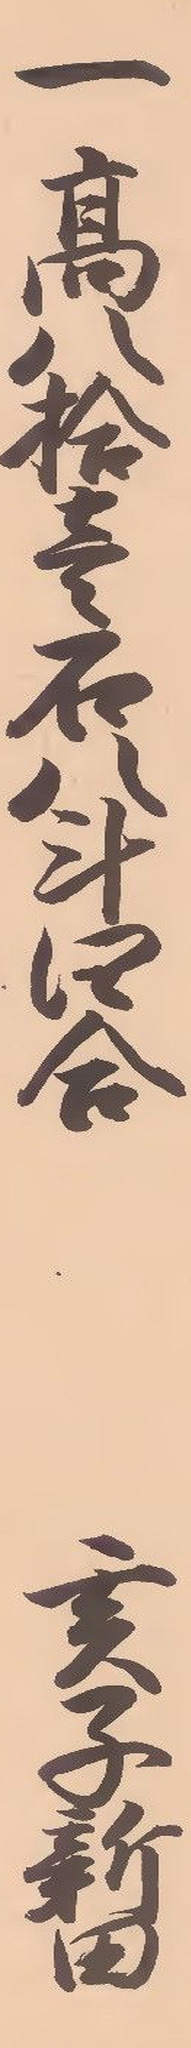一高八拾壱石八斗四合亥子新田
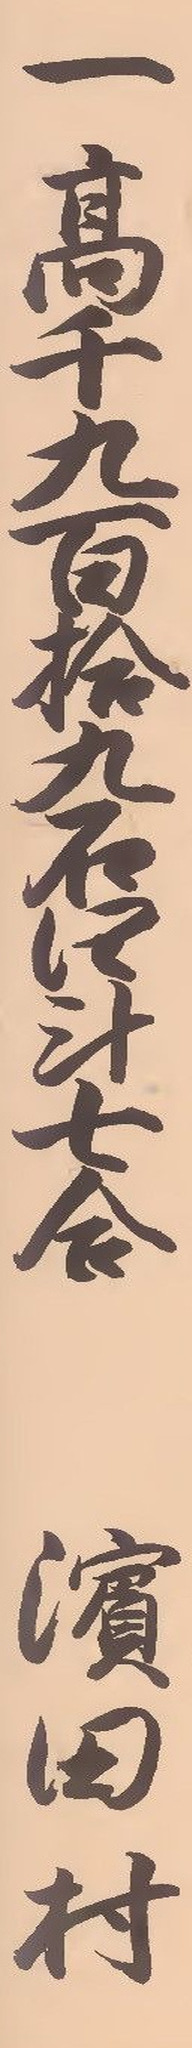一高千九百拾九石四斗七合浜田村
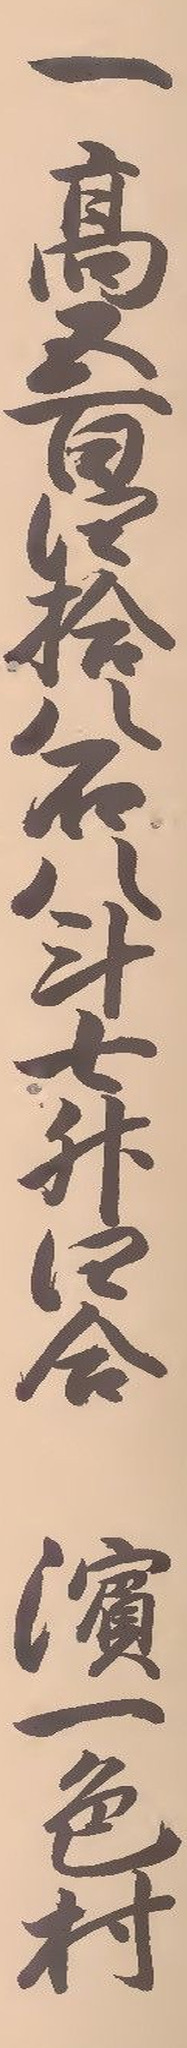一高五百四拾八石八斗七升四合浜一色村
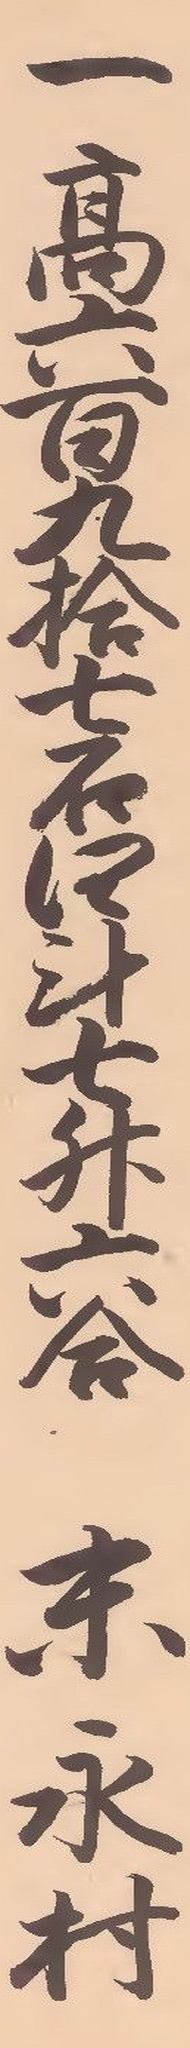一高六百九拾七石四斗七升六合末永村
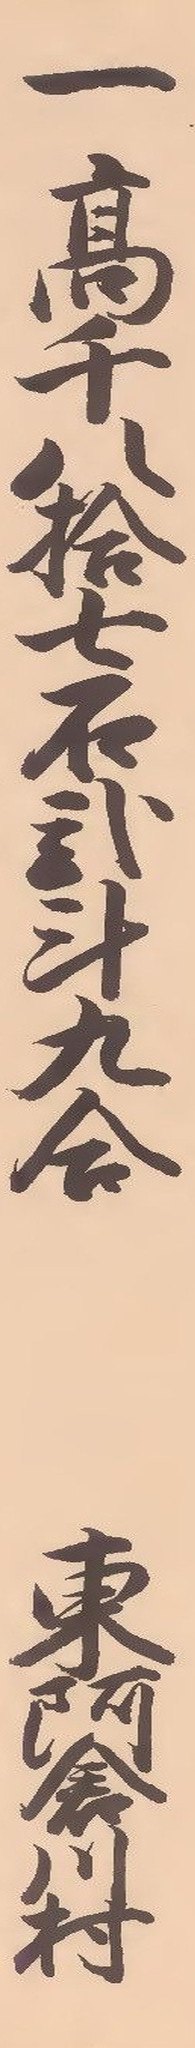一高千八拾七石弐斗九合東阿倉川村
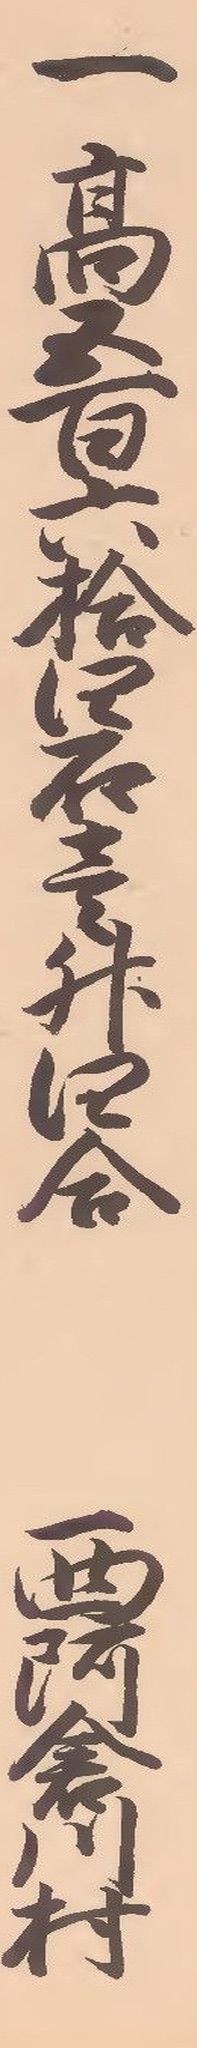一高五百六拾四石壱升四合西阿倉川村

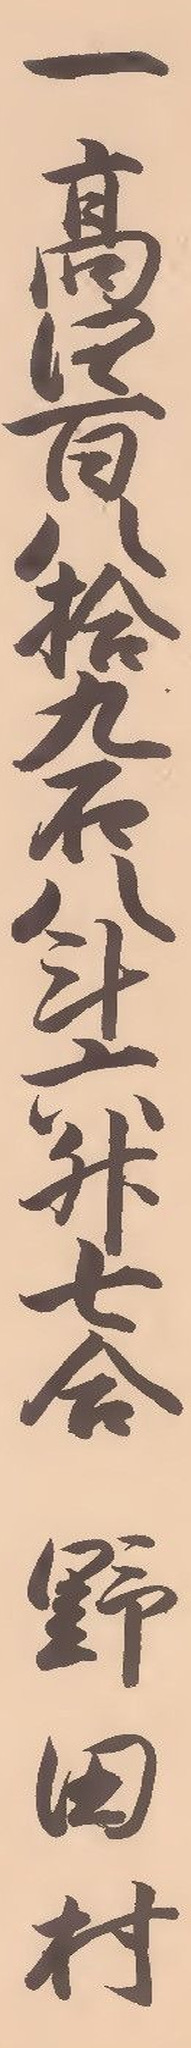一高四百八拾九石八斗六升七合野田村
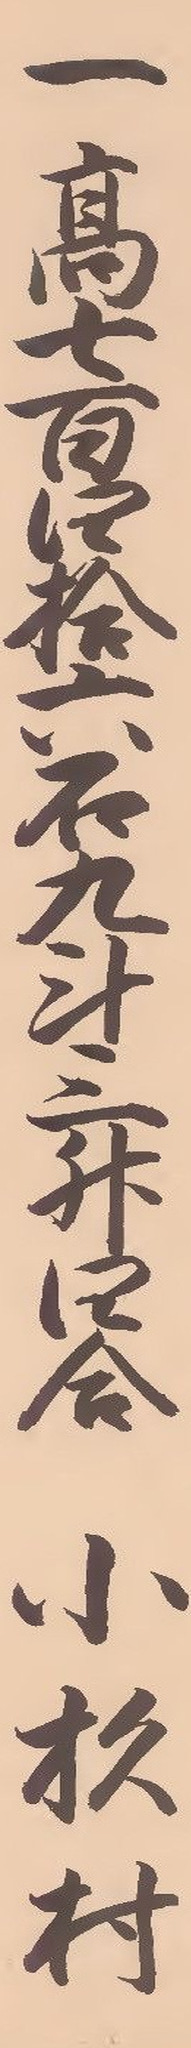一高七百四拾六石九斗三升四合小杉村
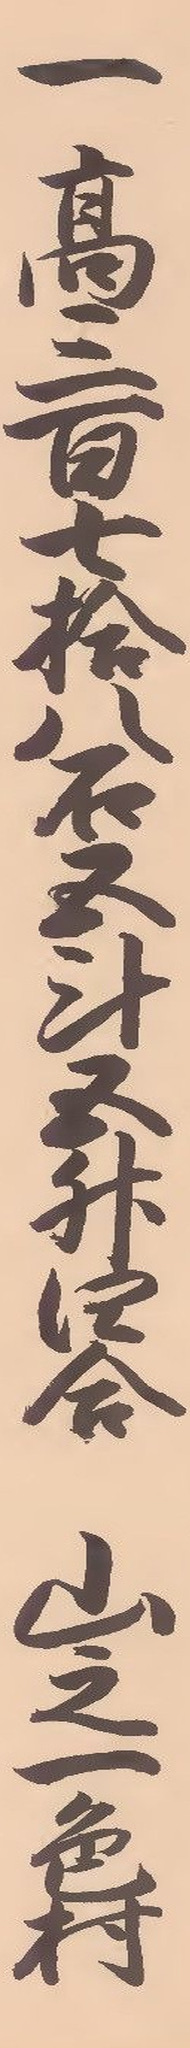一高三百七拾八石五斗五升四合山之一色村
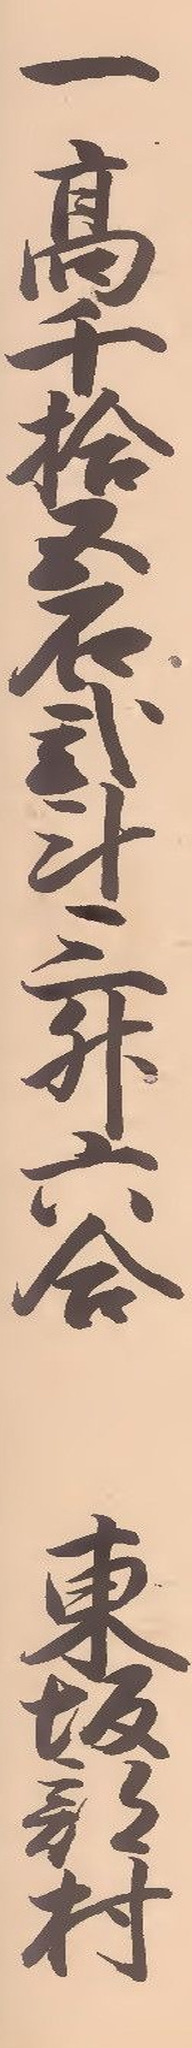一高千拾五石弐斗三升六合東坂部村
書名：伊勢国郷帳
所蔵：国立公文書館 National Archives of Japan
